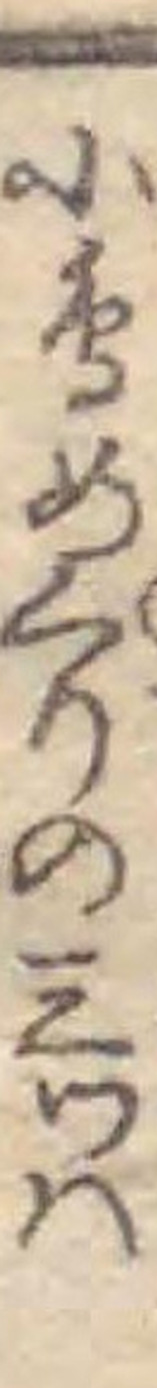小鳥めくりの三つは
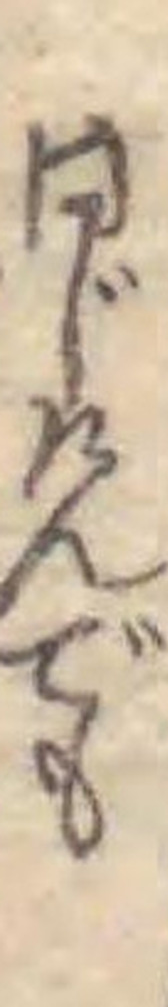同じけんでも
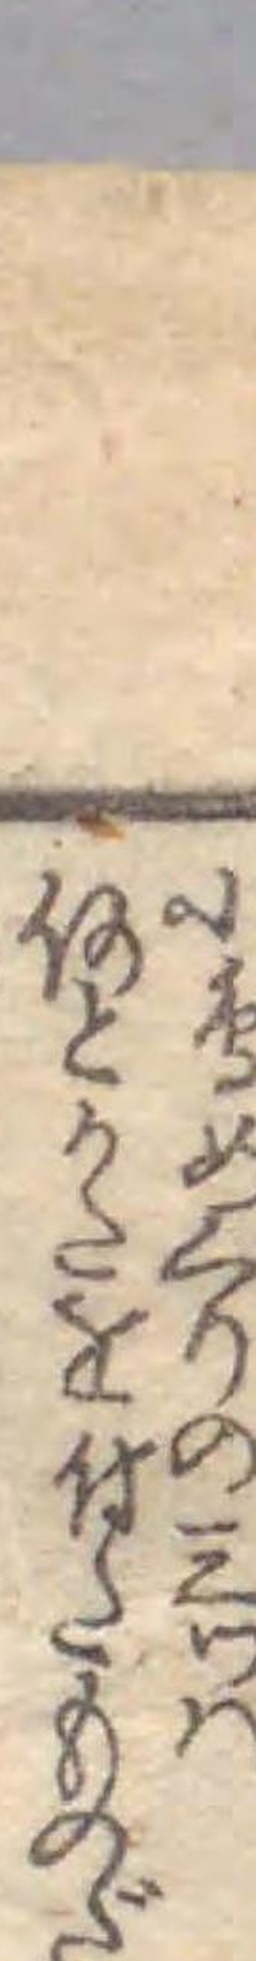何とかたを付たものだ
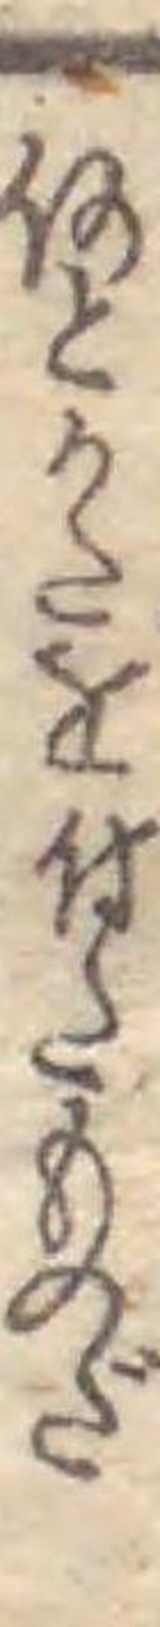何とかたを付たものだ
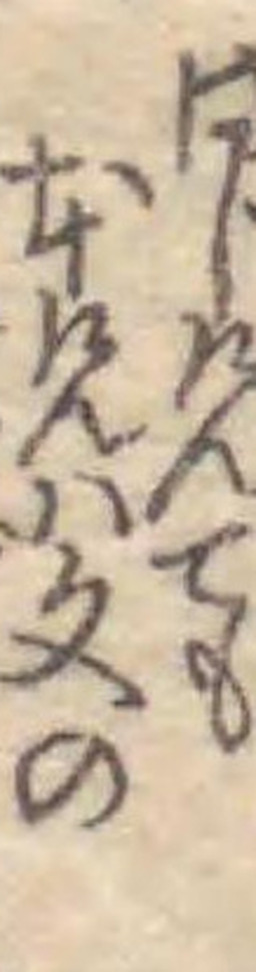本けんは文の
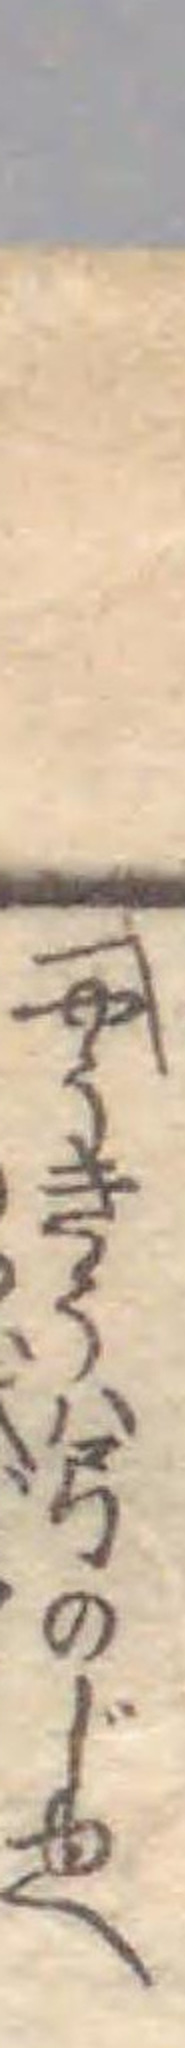〽やうきうは弓のじゆへ
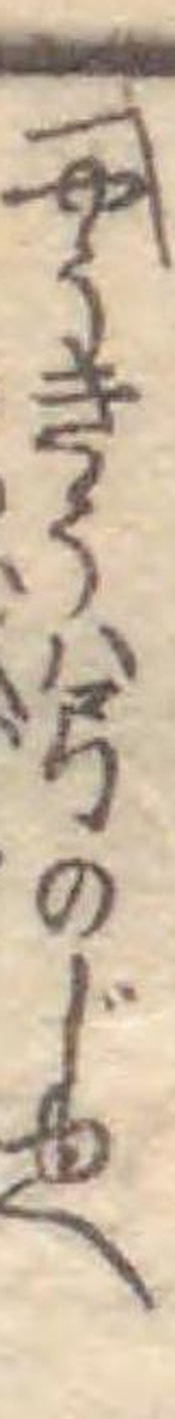〽やうきうは弓のじゆへ
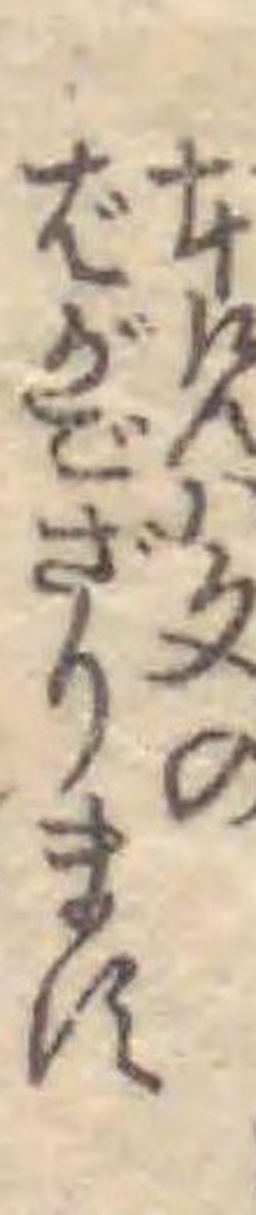ばがござります
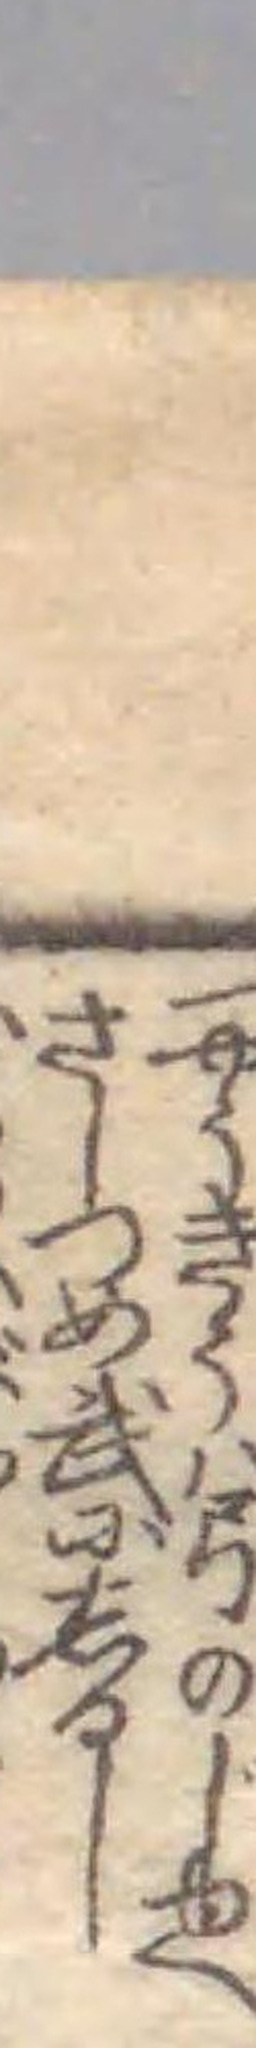さしつめ武にしるし
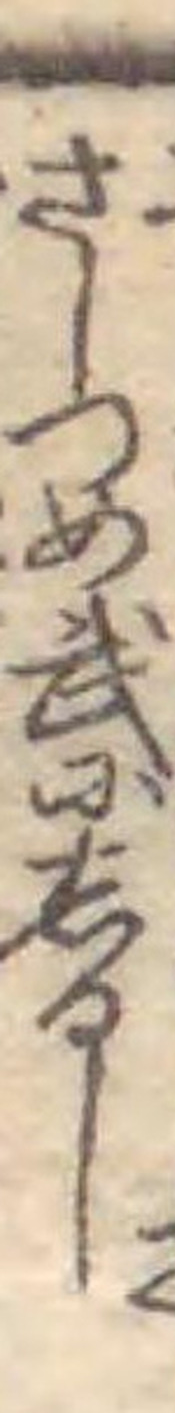さしつめ武にしるし
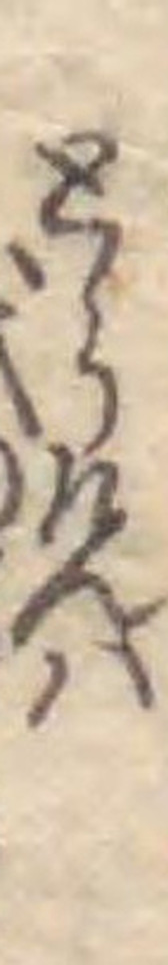とらけんは
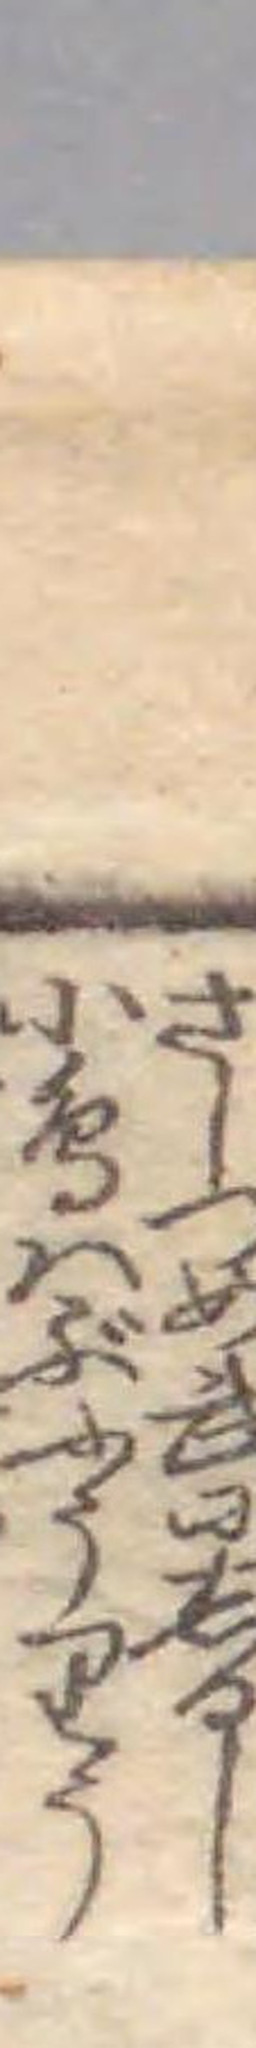小鳥はぶふうりう
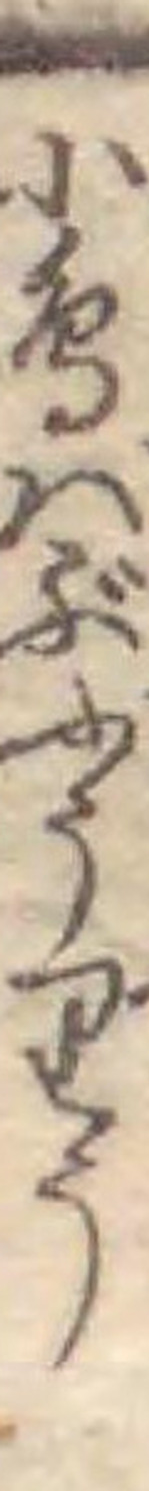小鳥はぶふうりう
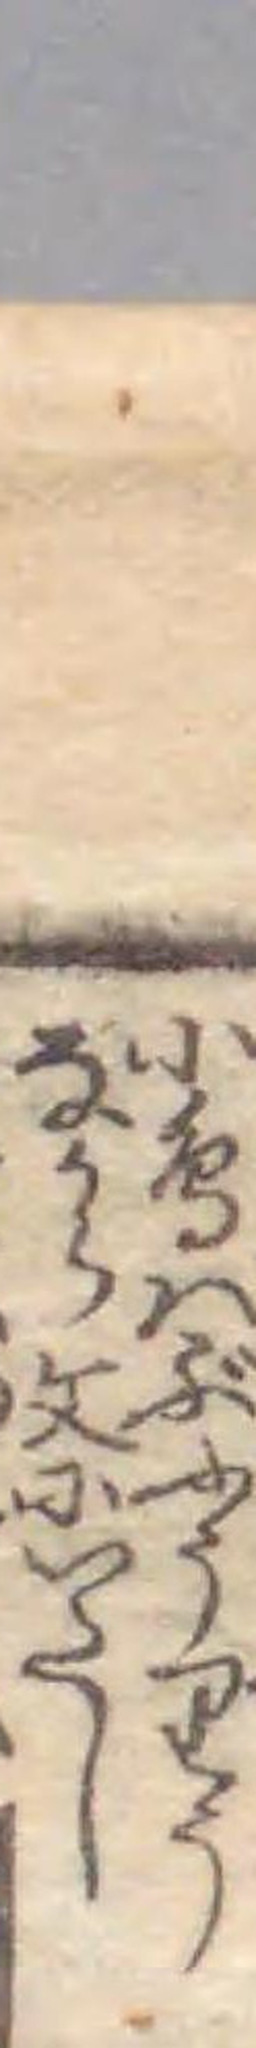なから文にいたし
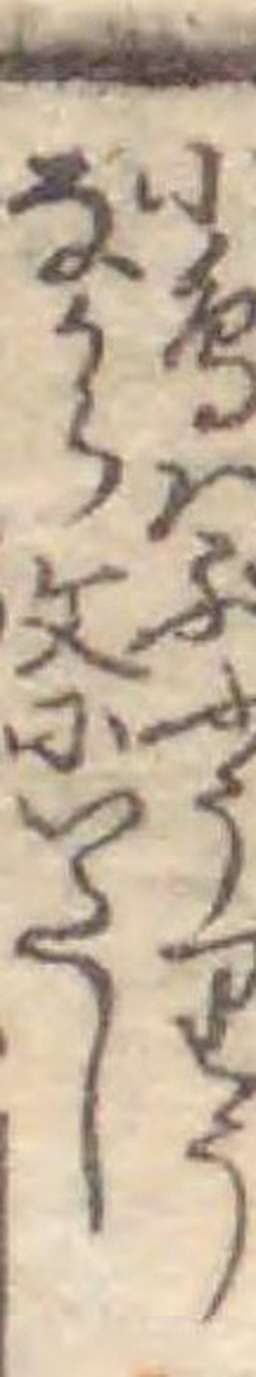なから文にいたし
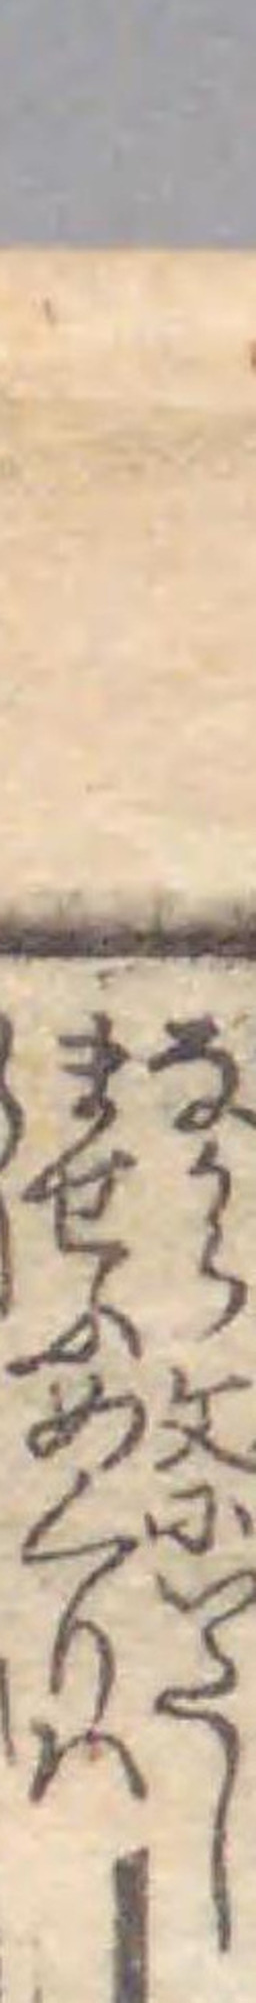ませふめくりは
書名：文武二道万石通 : 3巻
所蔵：国立国会図書館 National Diet Library, JAPAN
